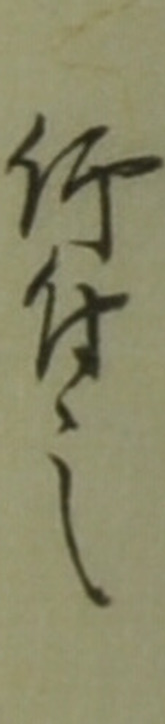仰付之

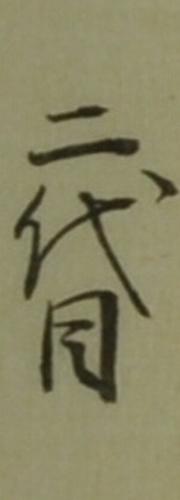二代目
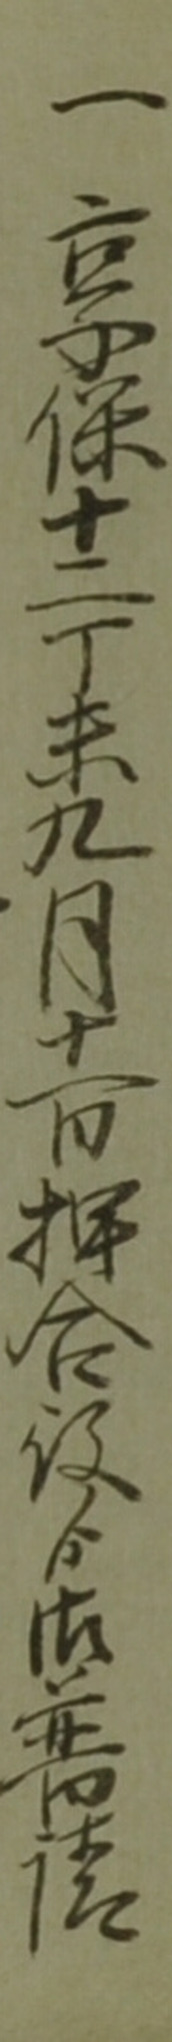一享保十二丁未九月十一日押合役ゟ御普請
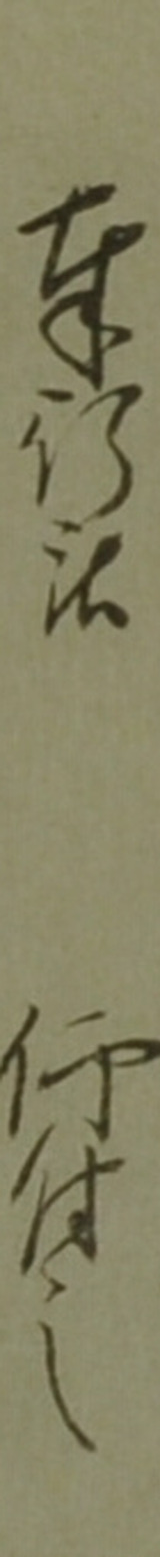奉行被仰付之
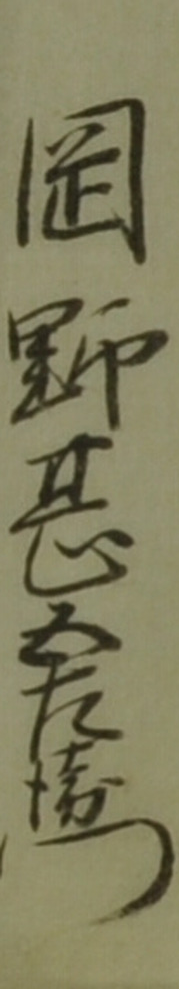岡野甚五左衛門
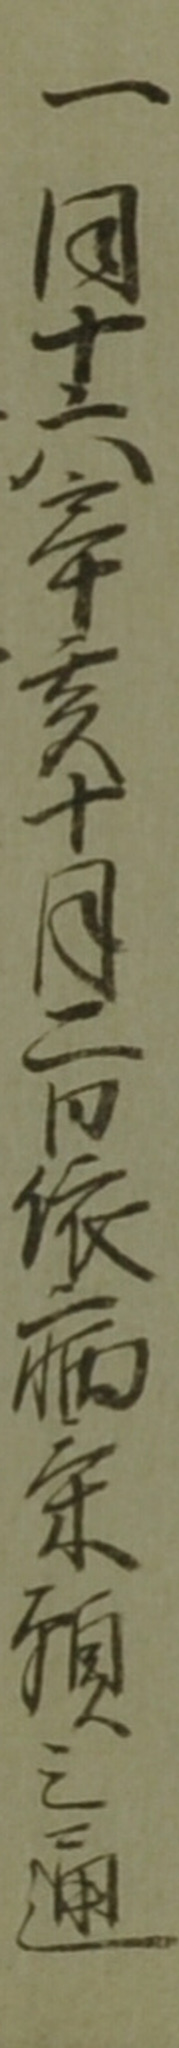一同十六辛亥十月二日依病気願之通
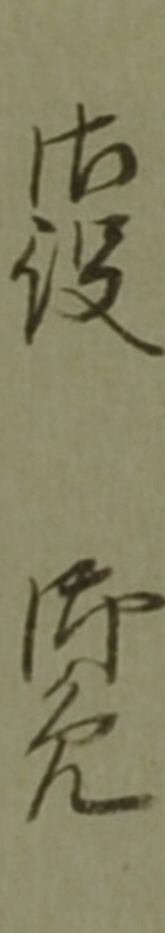御役御免
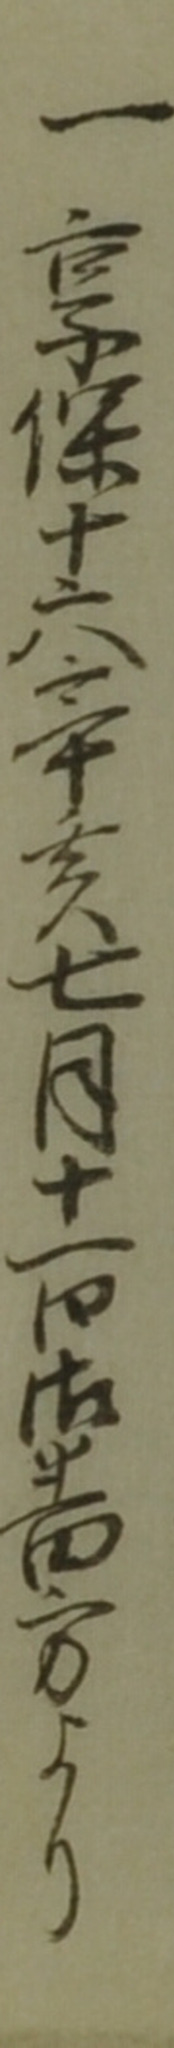一享保十六辛亥七月十一日御番方より
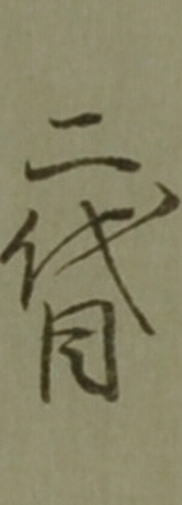二代目
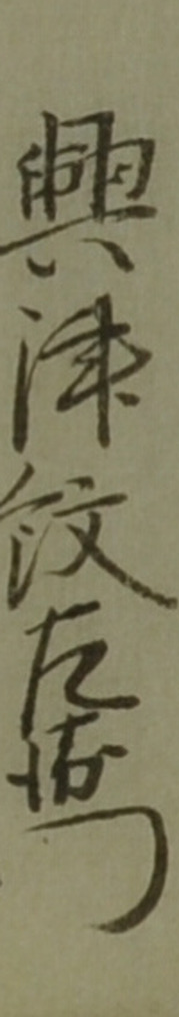興津紋左衛門
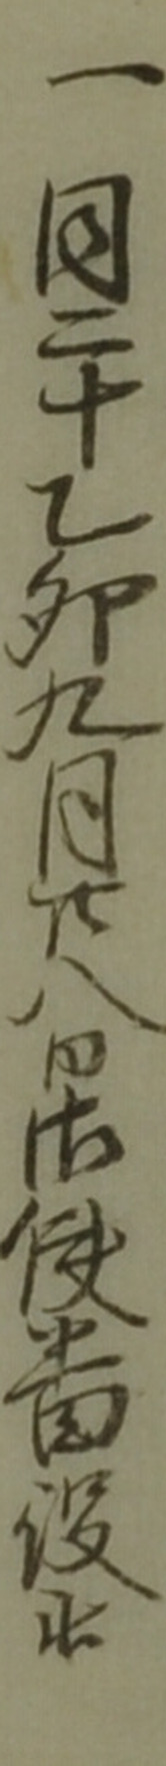一同二十乙卯九月廿八日御使番役被
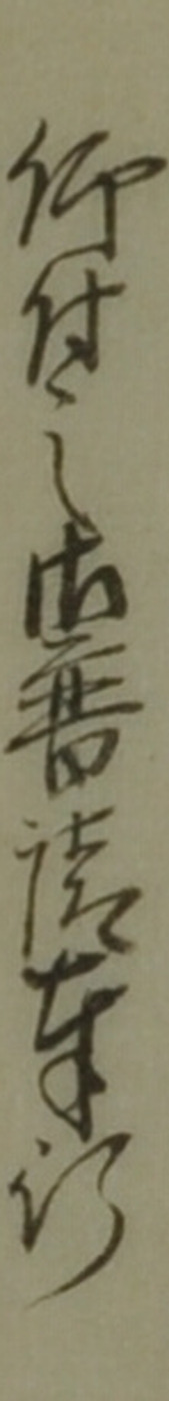仰付之御普請奉行
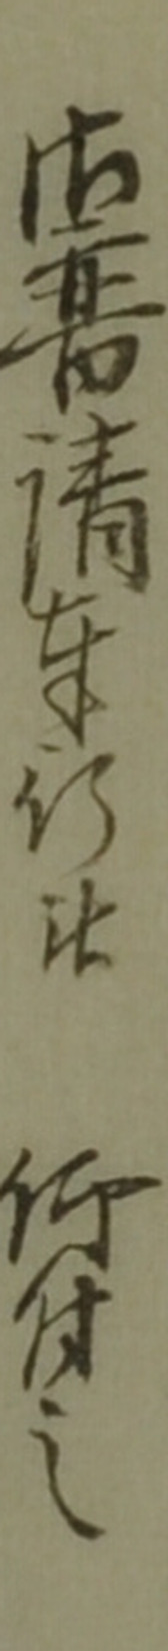御普請奉行被仰付之
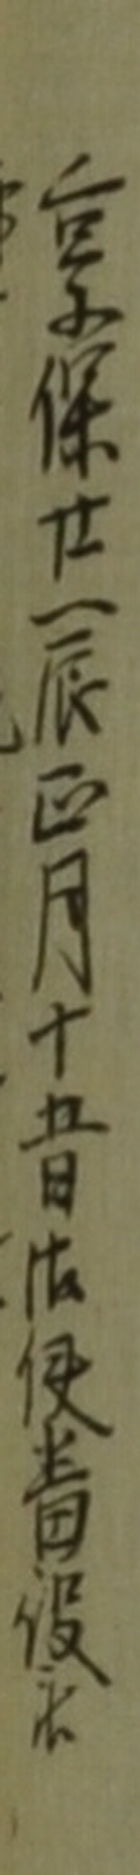享保廿一辰正月十五日御使番役被
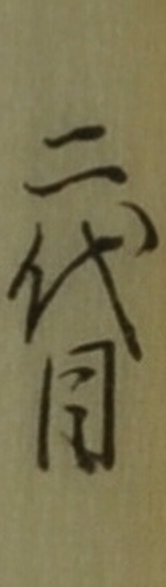二代目
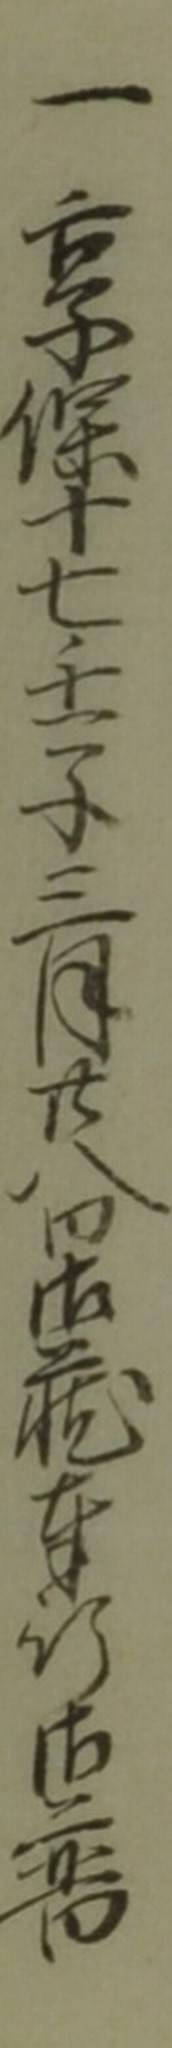一享保十七壬子三月廿八日御蔵奉行御普
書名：諸御役代々録（六）
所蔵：伊那市立高遠町図書館・合同会社AMANE
